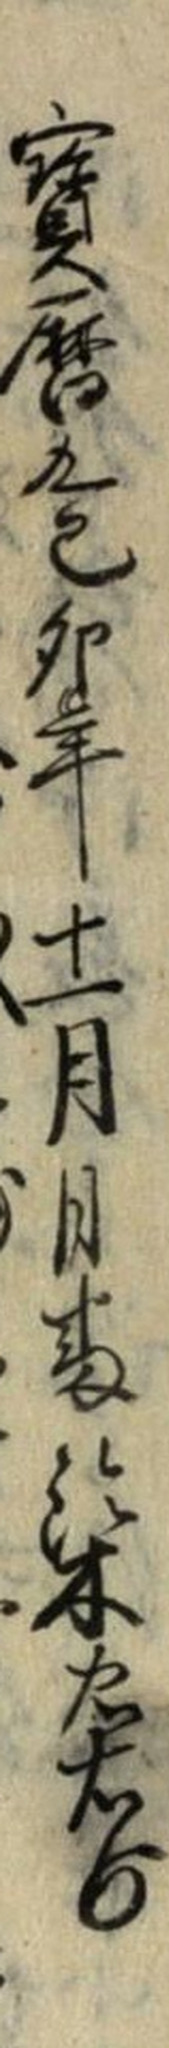宝暦九乙卯年十一月番鈴木忠右衛門
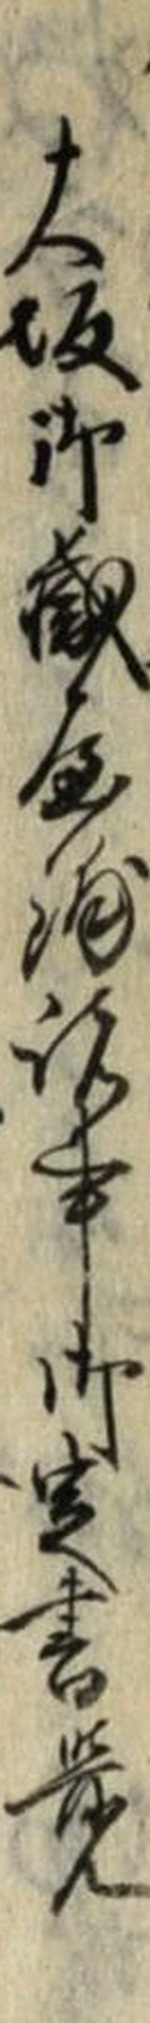大坂御蔵屋鋪諸事御定書覚
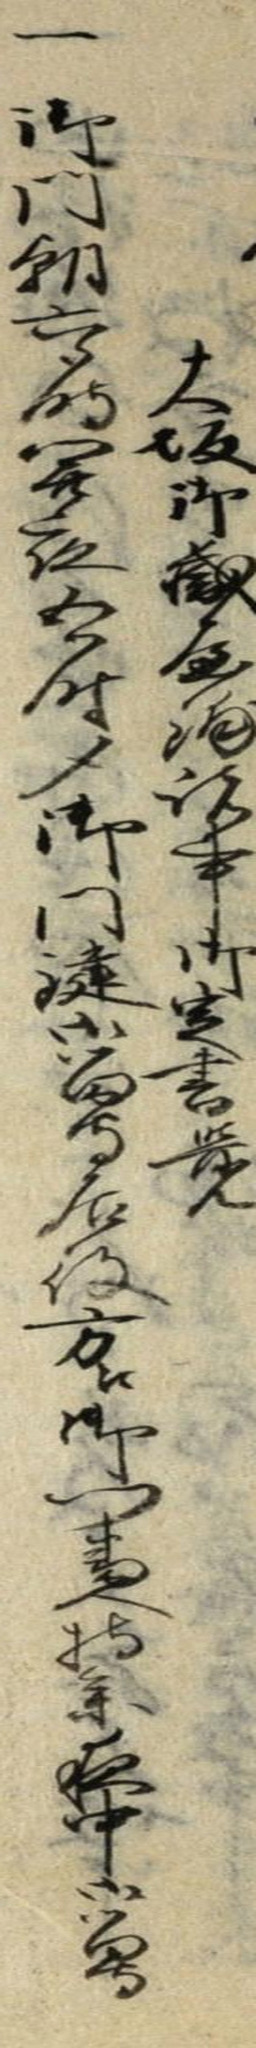一御門朝六ツ時開夜五ツ時〆御門鍵御留守居役方江御門番人持参夜中御留守
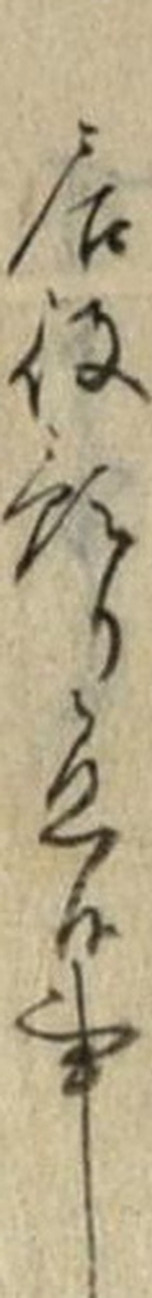居役預り置候事
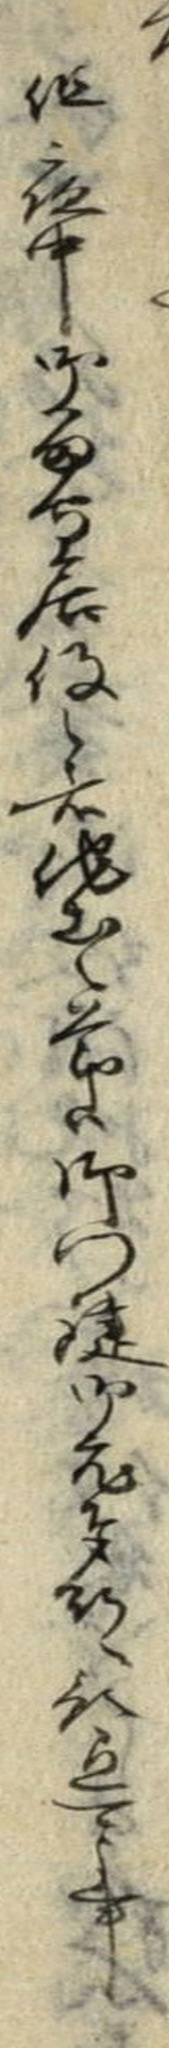但夜中御留守居役之者他出之節ハ御門鍵御蔵奉行江預置可申事
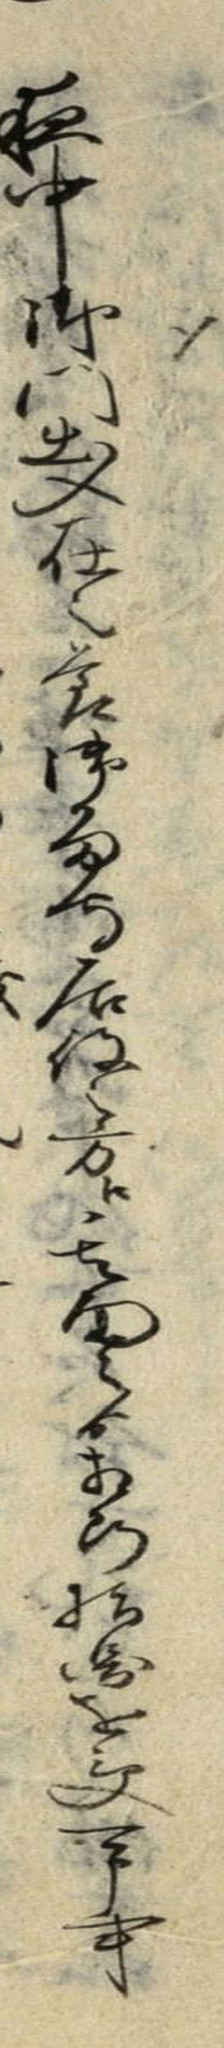一夜中御門出入在之節御留守居役之方江其面々ゟ相断指図を受可申事
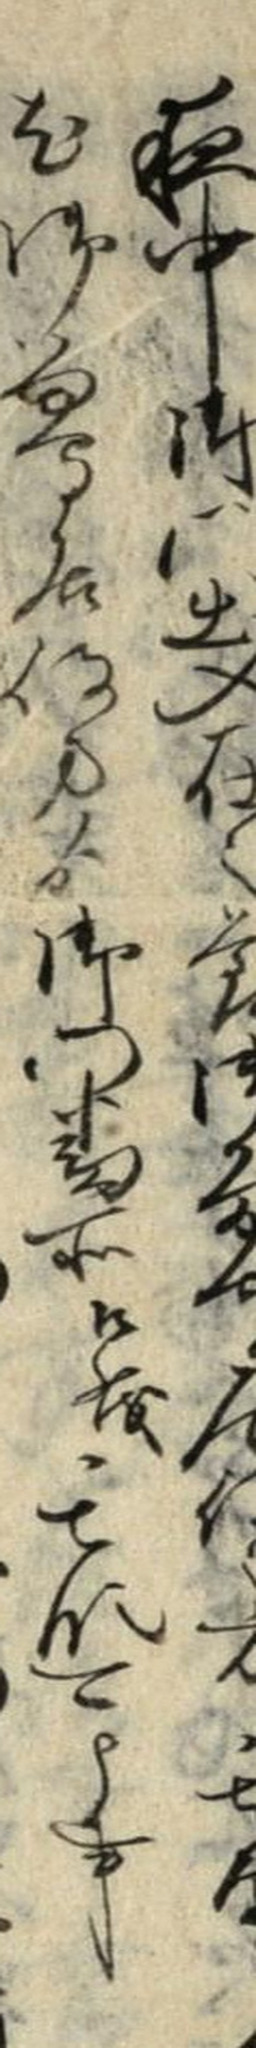尤御留守居役方ゟ御門番所江茂其段可申事
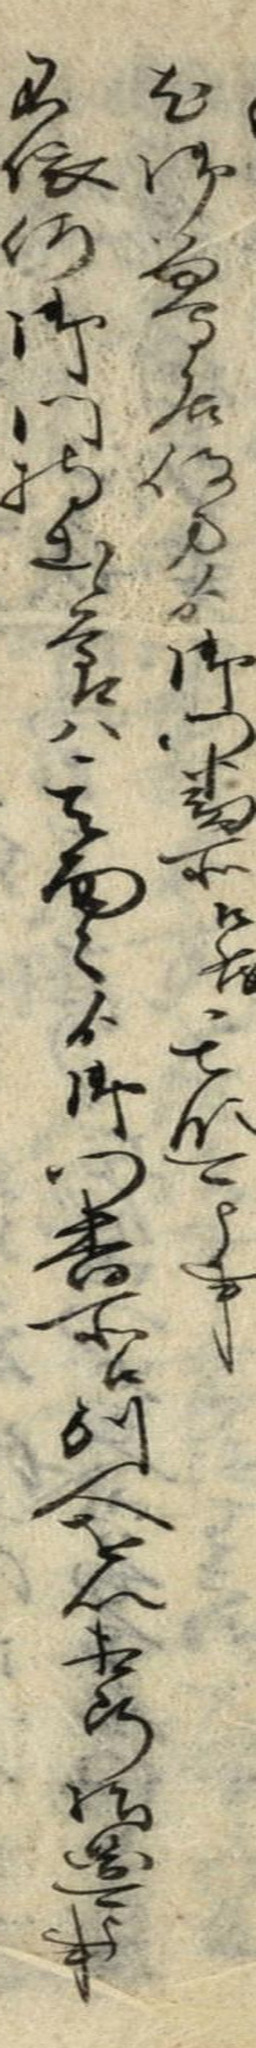一不依何御門持出候節ハ其面々ゟ御門番所江別人を以相断指図可申事
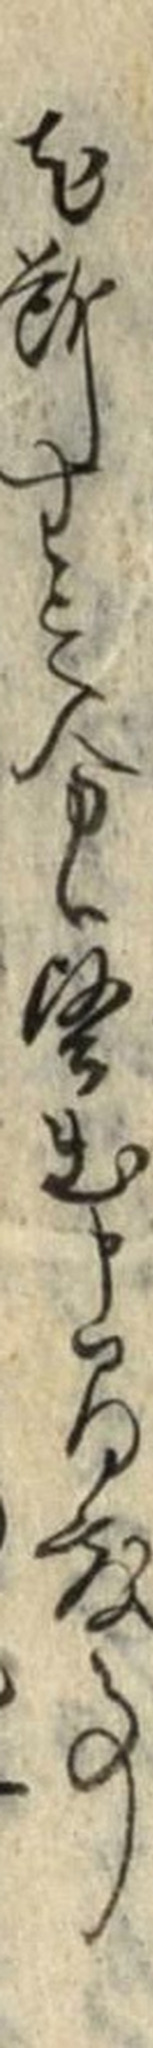尤断無之分ハ堅出申間敷事
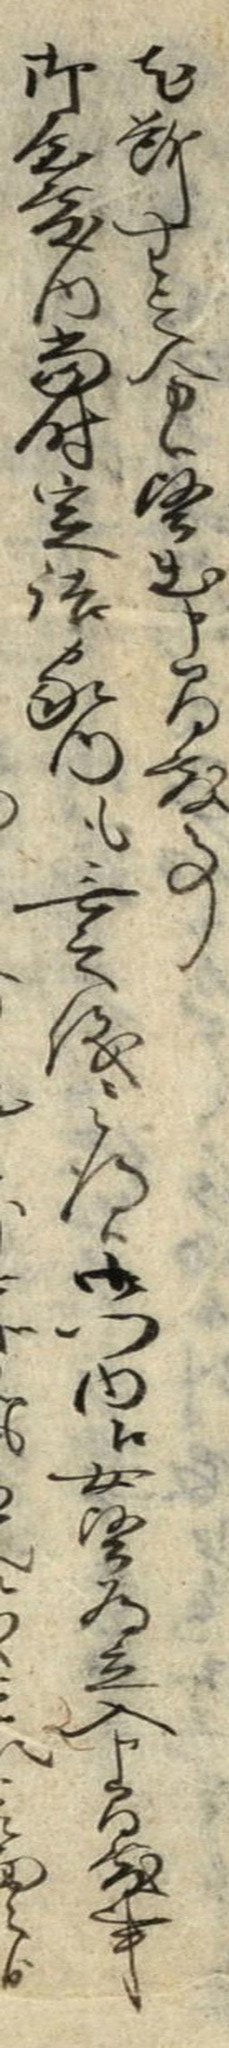一御屋敷内当時定詰家内も無之儀ニ候得ハ御門内江女堅為立入申間敷事
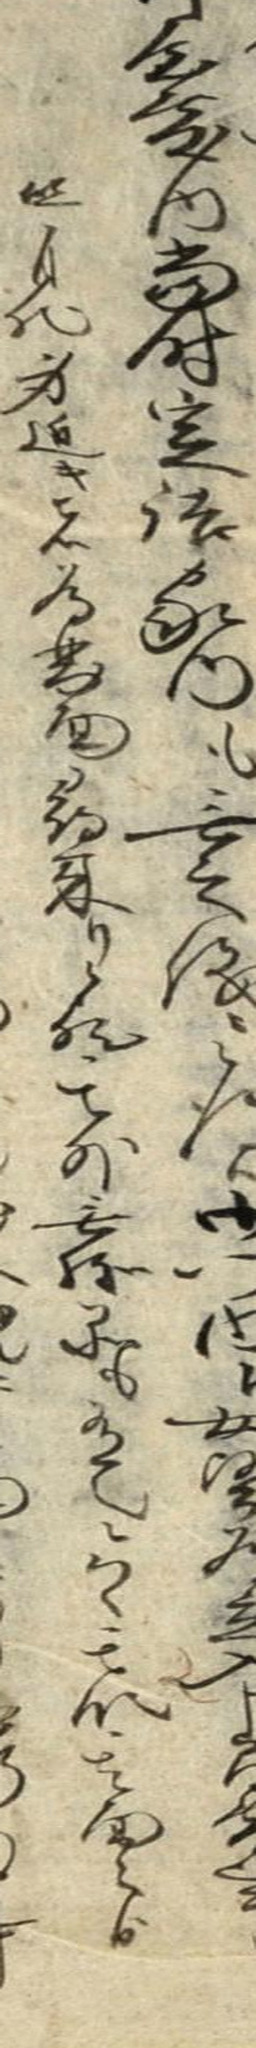但自然身近キ者為対面尋来り候歟其外無拠品も有之候ハヽ其段其面々ゟ
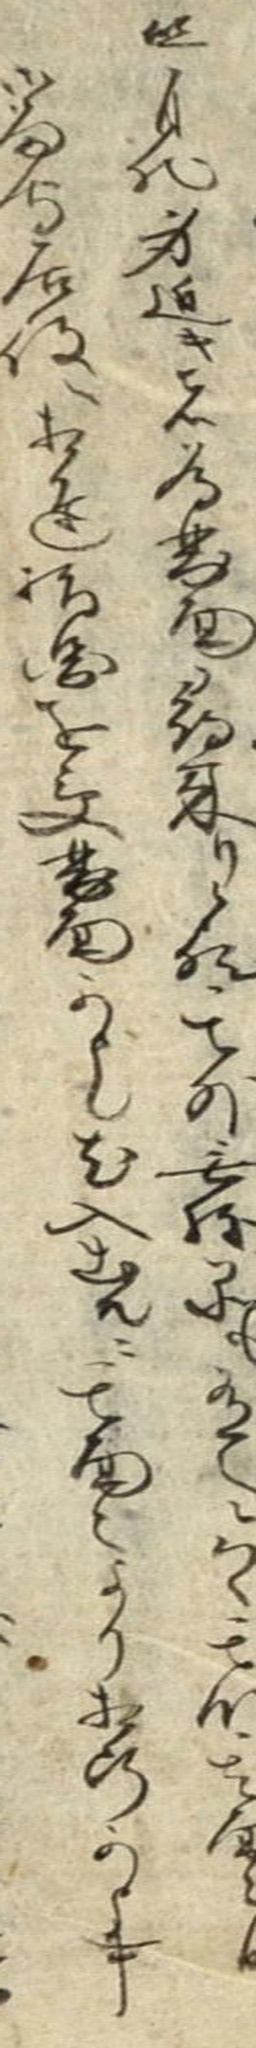御留守居役へ相達指図を受対面可申候尤入出ルニ其面々より相断可申事
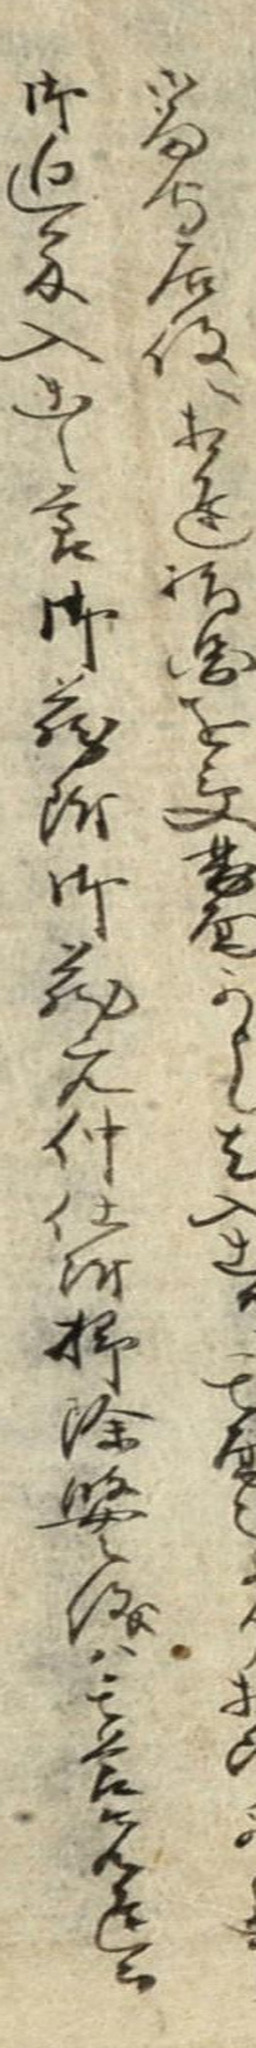御廻米入出之節御蔵附御蔵元仲仕附掃除婆之儀ハ其節先達而
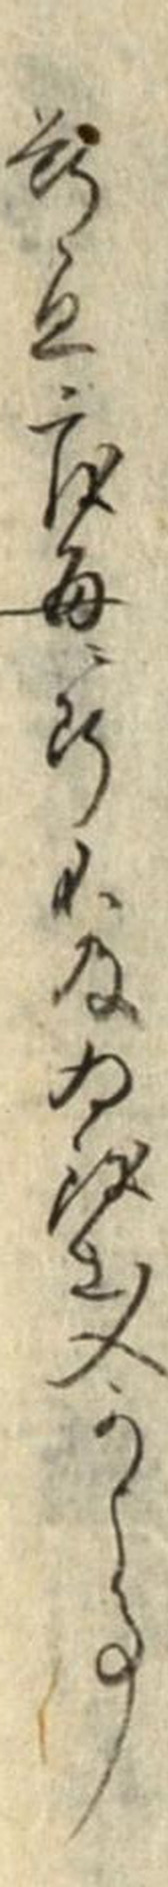断置度毎ニ断不及為致出入可申事

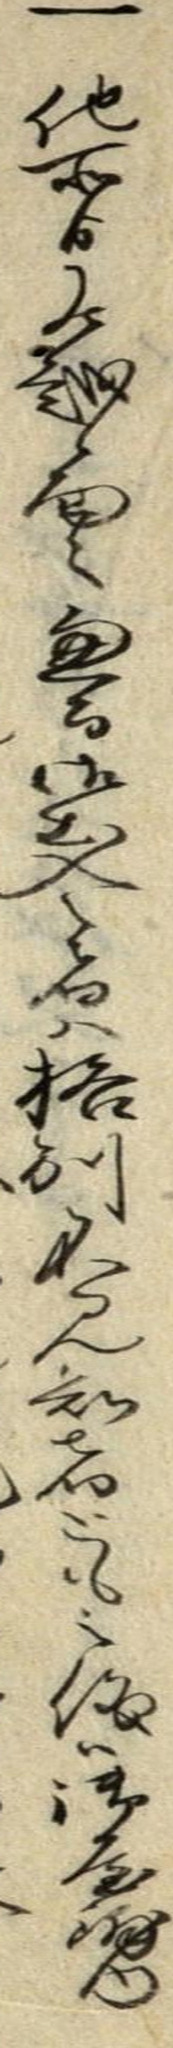一他所ゟ罷越候面々兼而御出入之者ハ格別不見知者とも之儀ハ御屋鋪内
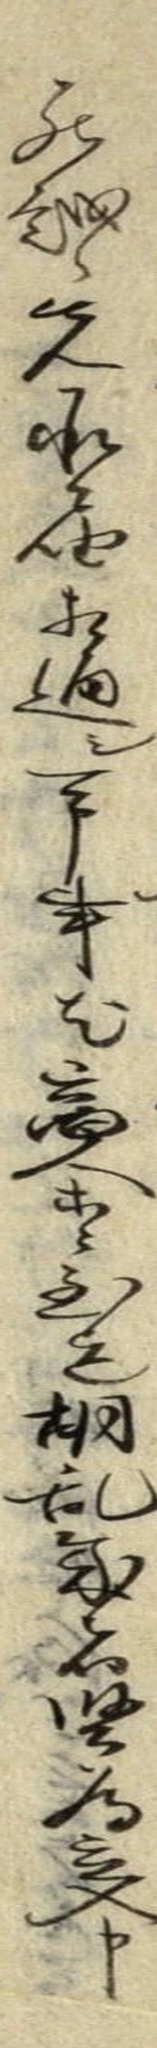罷越候先承届相通シ可申事尤商人等ニ至迄胡乱成者堅為立入申
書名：三都并道中之部
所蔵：福井県文書館 Fukui Prefectural Archives
